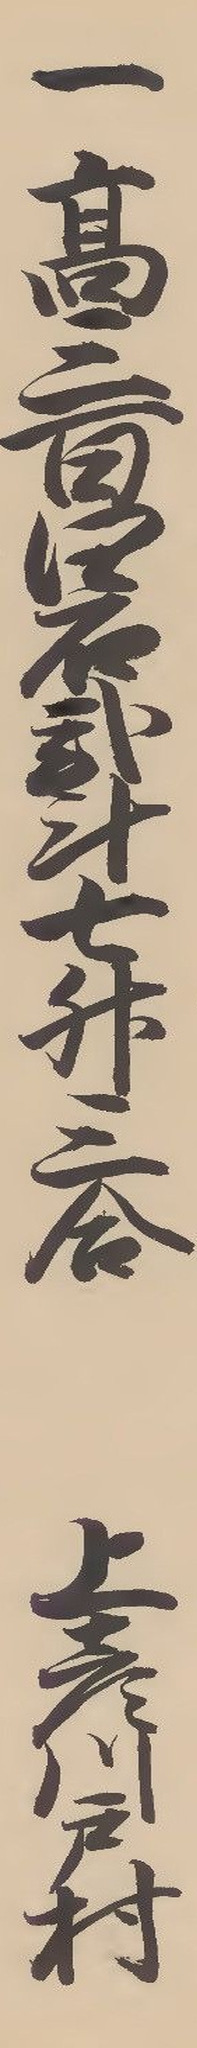一高三百四石弐斗七升三合上彦川戸村

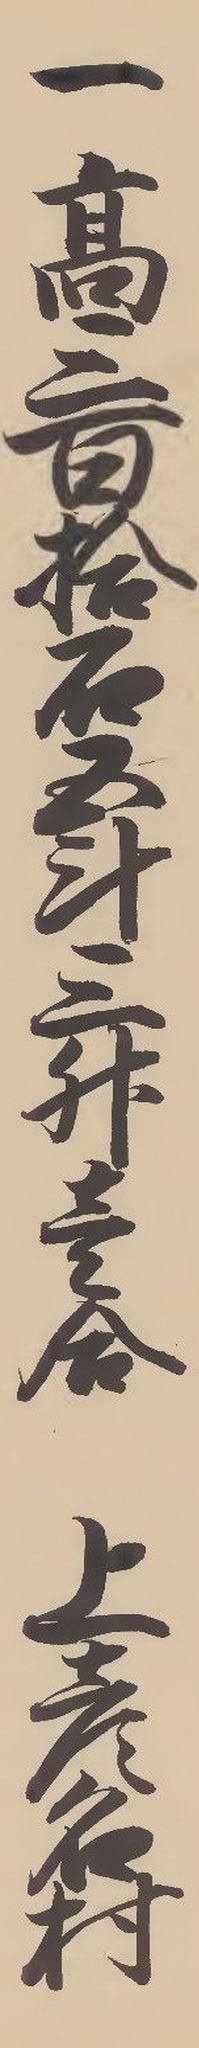一高三百拾石五斗三升壱合上彦名村
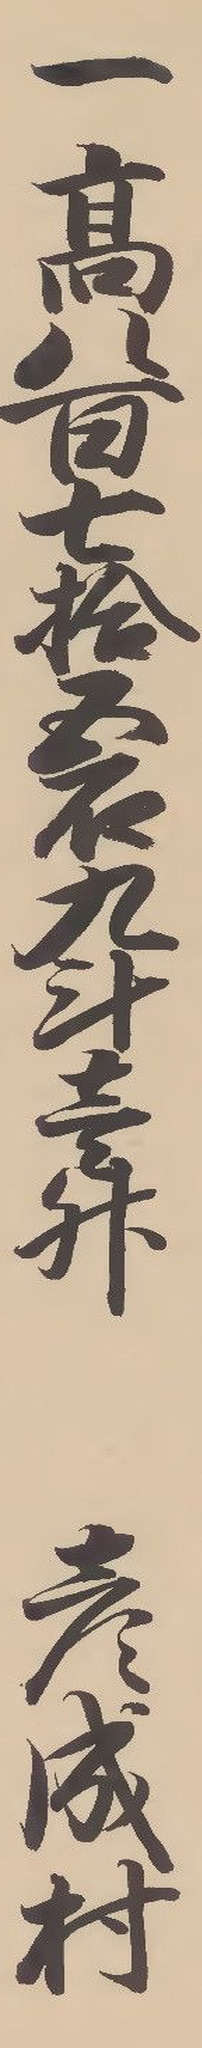一高八百七拾五石九斗壱升彦成村
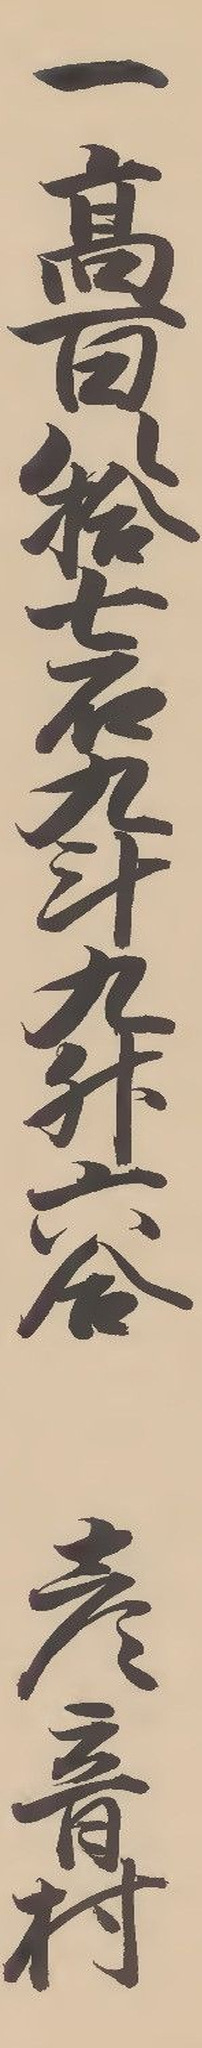一高百八拾七石九斗九升六合彦音村
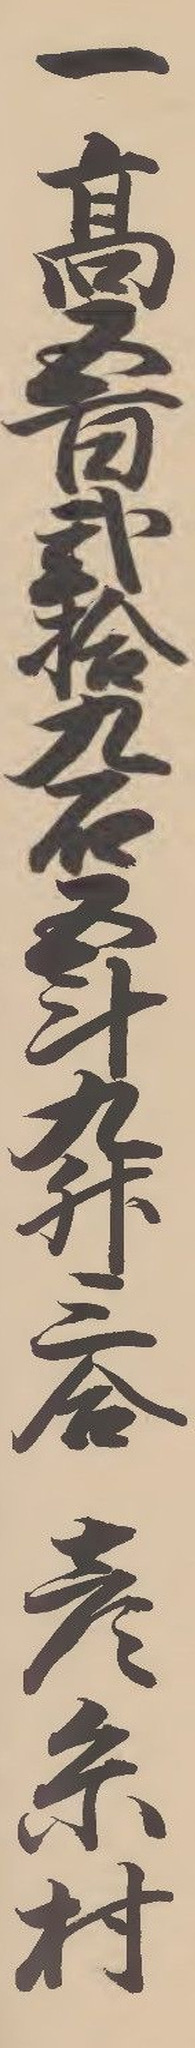一高五百弐拾九石五斗九升三合彦糸村
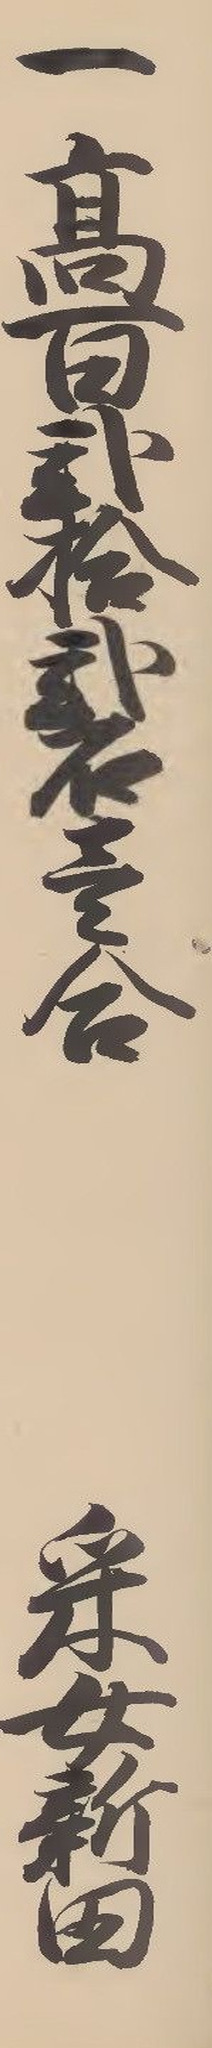一高百弐拾弐石壱合采女新田
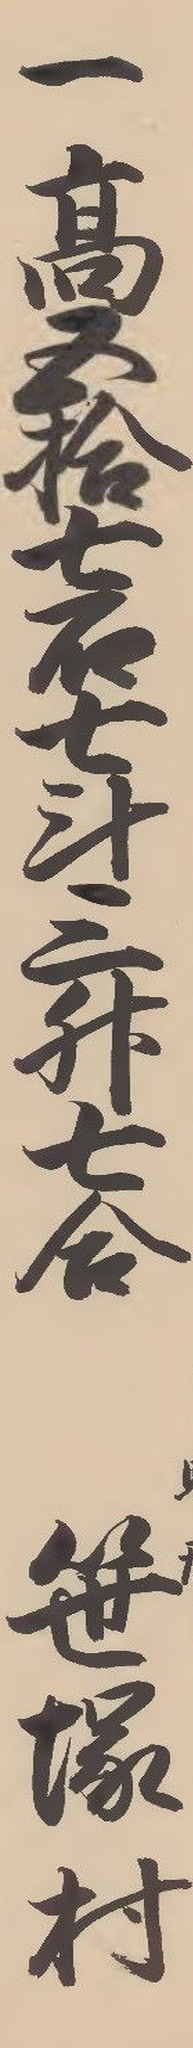一高五拾七石七斗三升七合笹塚村
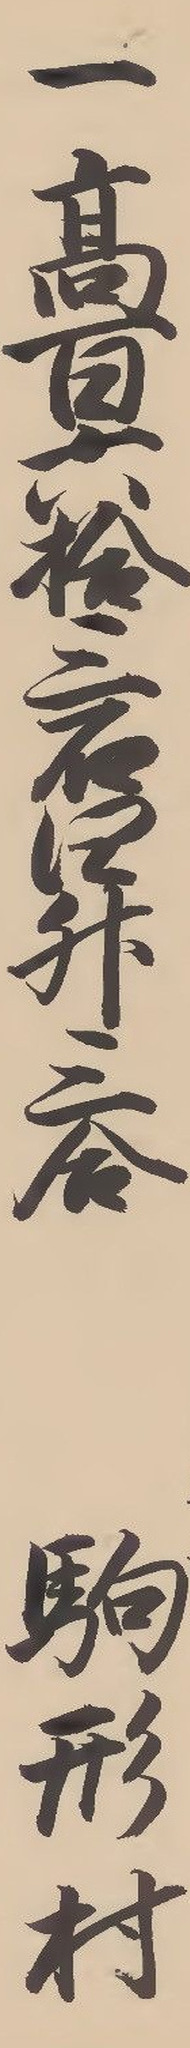一高百六拾三石四升三合駒形村
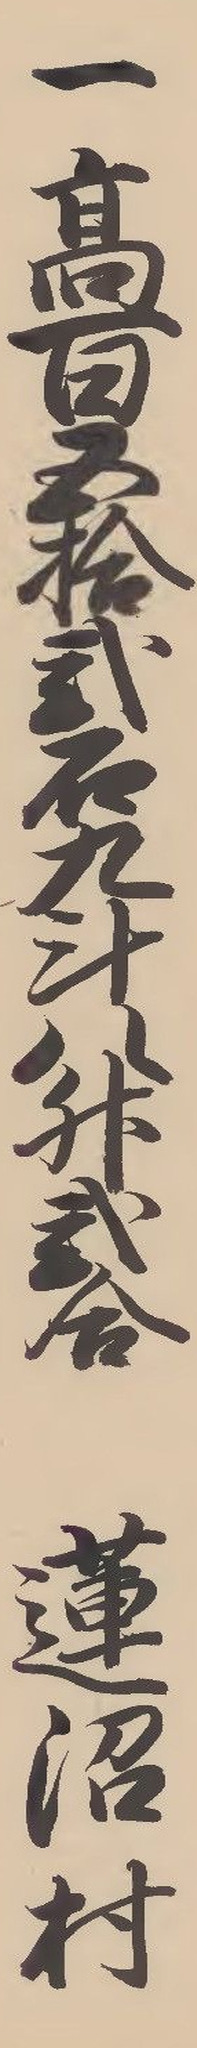一高百五拾弐石九斗八升弐合蓮沼村

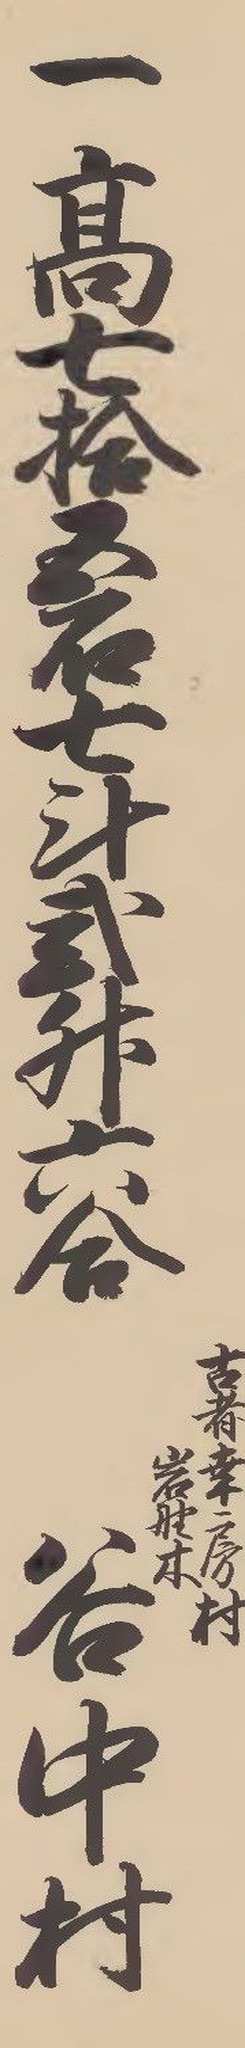一高七拾五石七斗弐升六合谷中村
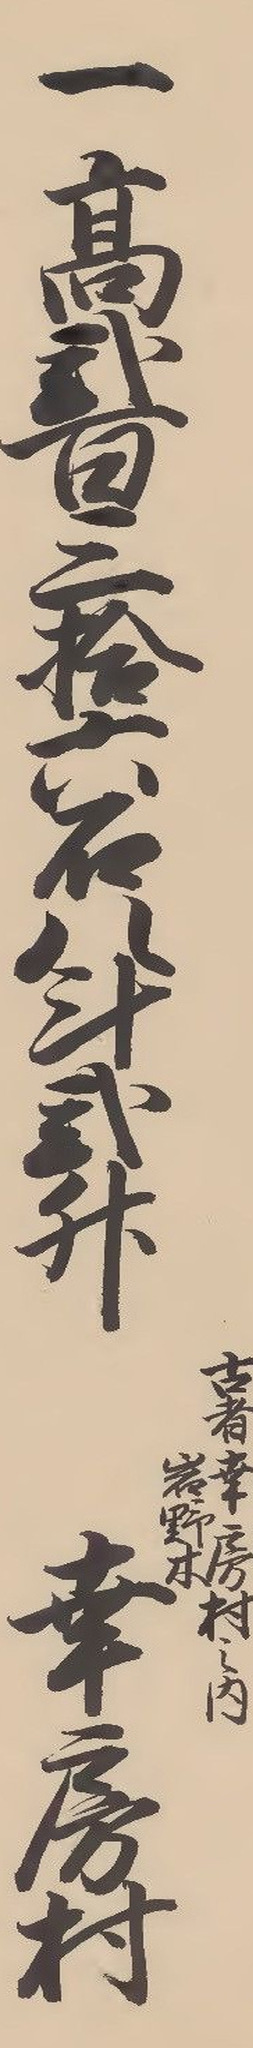一高弐百二拾六石八斗弐升幸房村
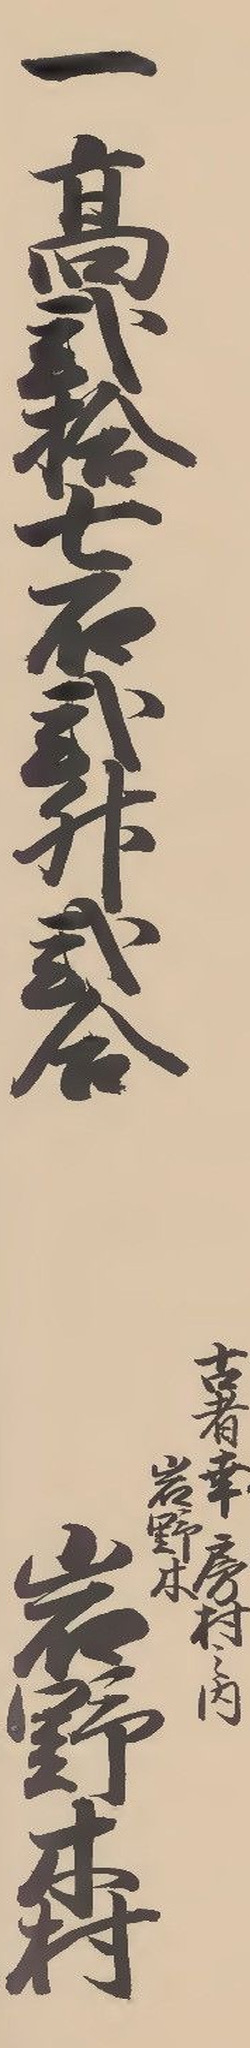一高弐拾七石弐升弐合岩野木村
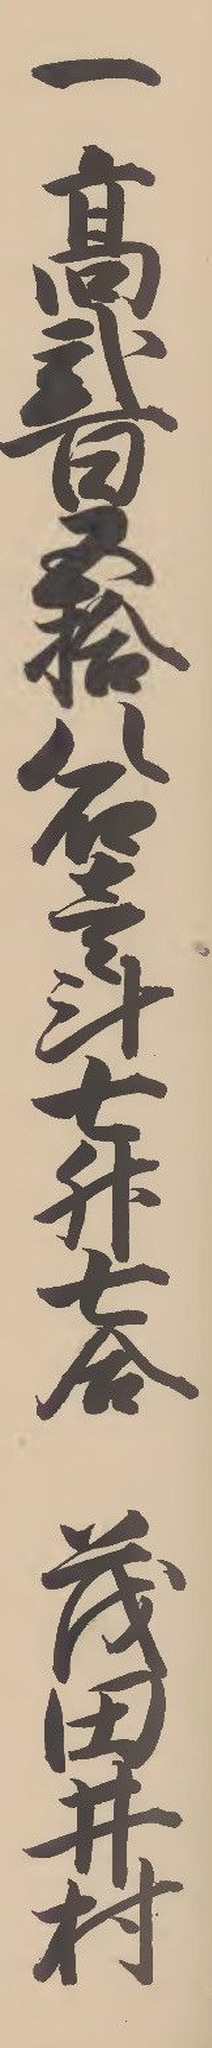一高弐百五拾八石壱汁七升七合茂田井村
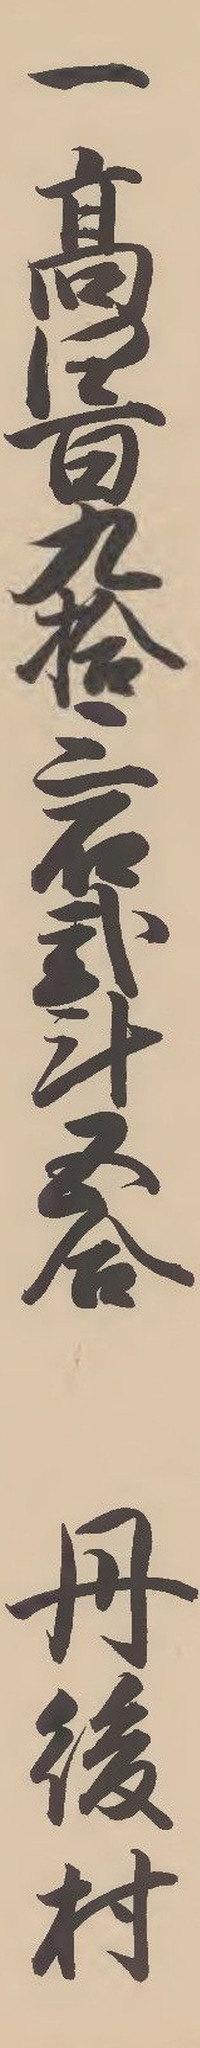一高四百九拾三石弐斗五合丹後村
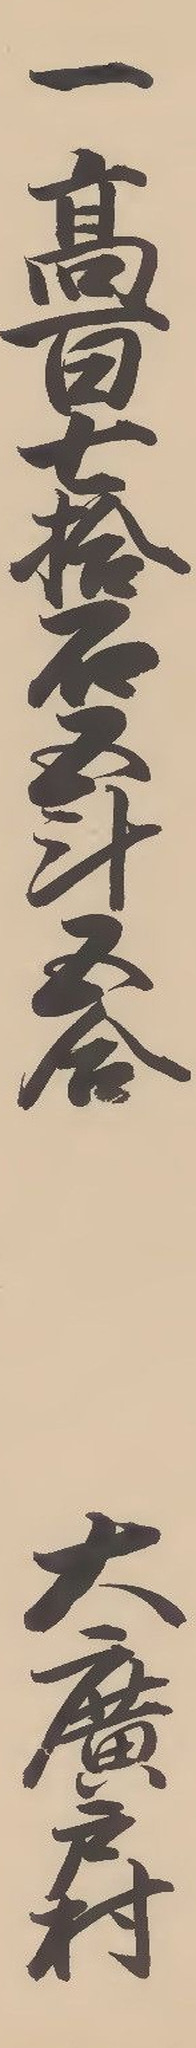一高百七拾石五斗五合大広戸村
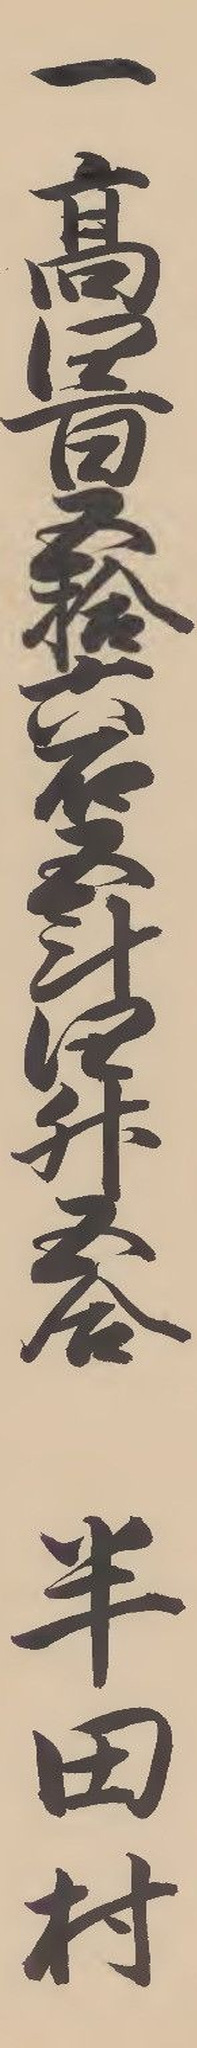一高四百五拾六石五斗四升五合半田村
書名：武蔵国郷帳　下
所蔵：国立公文書館 National Archives of Japan
